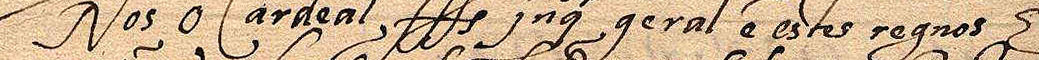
Nos o Cardeal Jffꝭ jnqor geral ē estes regnos E
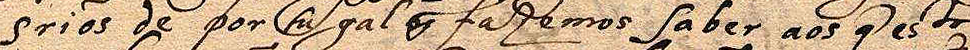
sriōs de portugal c̄ꝭ faZemos saber aos q̄ esta
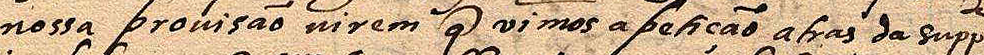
nossa prouisaõ uirem q̄ vimos a petiçaõ atras da suppte
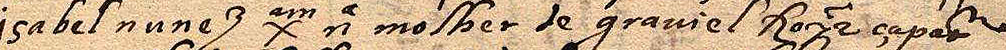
jsabel nunez xam na molher de grauiel Royz̄ çapatro
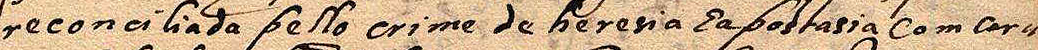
reconciliada pello crime de heresia E apostasia com car
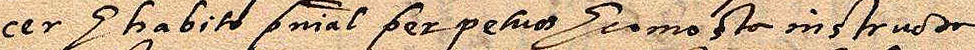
cer E habito pnīal perpetuos E como sta instructa
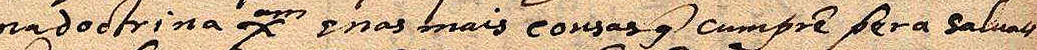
na doctrina xam E nas mais cousas q̄ cumprē pera salua
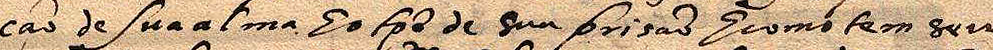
çaõ de sua alma E o tpō de sua prisaõ E como tem seu
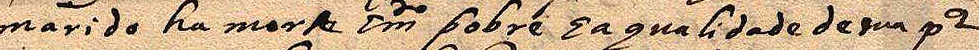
marido ha morte E mto pobre E a qualidade de sua pa
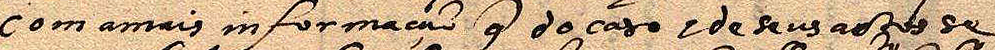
com a mais informaçaõ q̄ do caso E de seus actos se
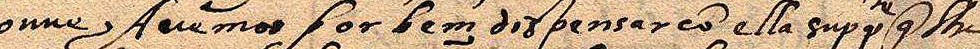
ouue Auemos por bem dispensar cō ella suppte q̄ lhe
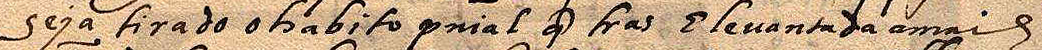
seja tirado o habito pnīal q̄ tras E leuantada a mais
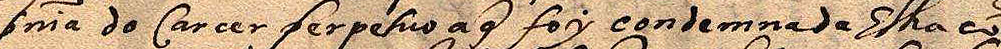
pnīa do Carcer perpetuo a q̄ foy condemnada E lha cō
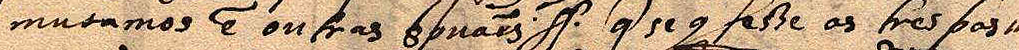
mutamos ē outras spuaēs .ss. q̄ se ꝯfesse as tres pas
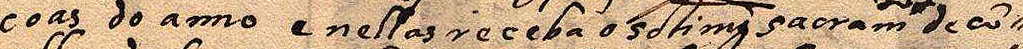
coas do anno e nellas receba o sctim̄o sacramto de cō
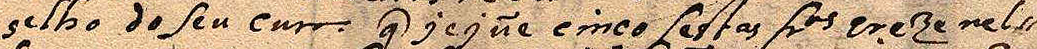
selho de seu cura. q̄ jejūe cinco sestas fras E reze nel
